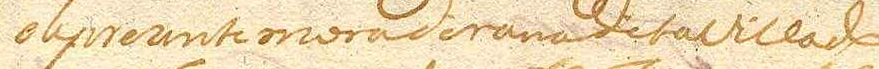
de prezente moradora na dita vila do
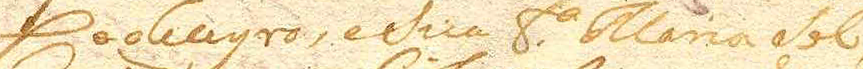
Codeceyro, e sua f.a Maria Sol
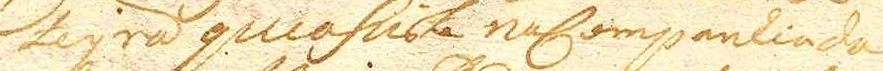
teyra que assiste na Companhia da
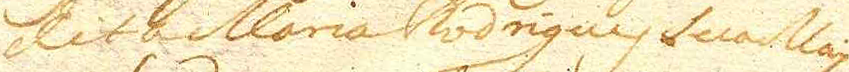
dita Maria Rodrigues sua Maj
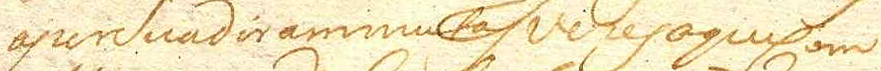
a persuadiram mutas vezes a que Com
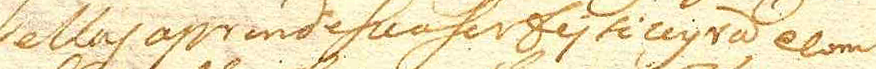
ellas aprendesse a ser fejticeyra, e com
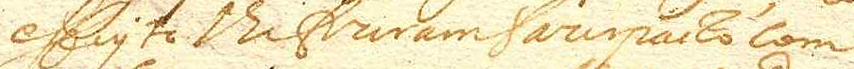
effeyto lhe fizeram fazer pacto com
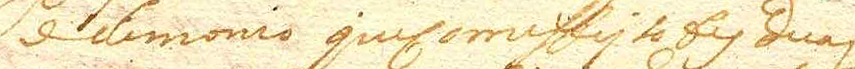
o demonio que Com effejto fes duas
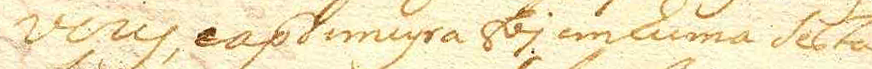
vezes, e a primeyra foj em huma sesta
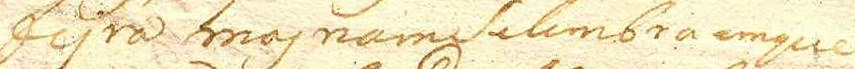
fejra mas nam se lembra em que
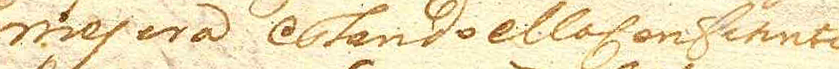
mes era estando ella Confitente
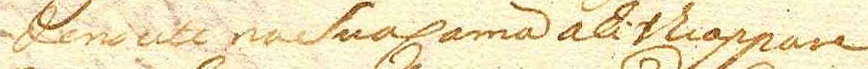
de noute na sua Cama ahi lhe appare
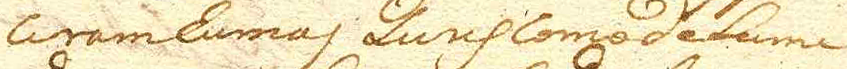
ceram humas Luzes como de Lume
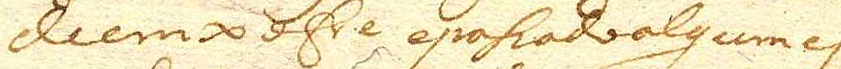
de emxofre e passado algum es
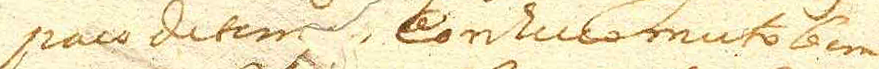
paco de tem__ conheceo muto bem
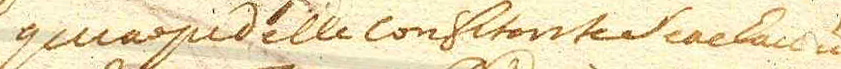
que ao pe delle confitente se achau_õ
